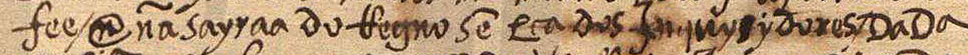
fee / e nā sayraa do Regno sē Lça dos Jnquysydores / DaDa
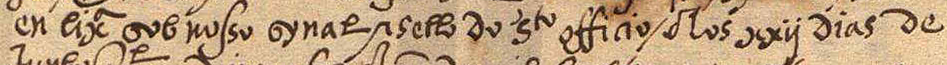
en lixa sob nosso synal e sello do Sto officio / Aos xxij dias de
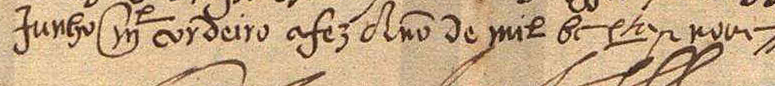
Junho mel cordeiro a fez An̄o de miL bc Lta e noue //
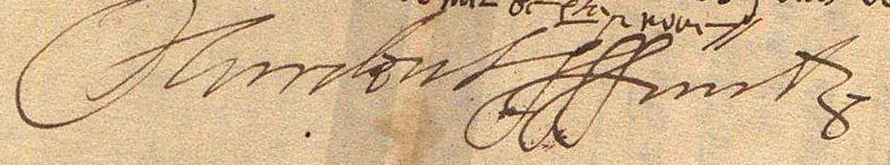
O Cardeal Jffantꝭ
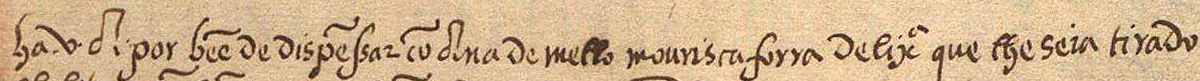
ha v. A. por bēe de dispēssar c̄o Ana de mello mourisca forra de lixa que lhe seia tirado
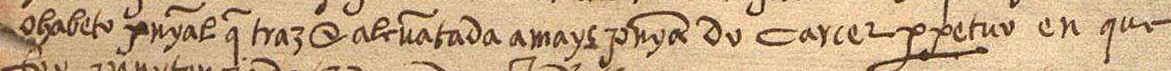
o habeto pnȳal q̄ traz e aleuātada a mays pn̄ya do Carcer ꝑpetuo en que
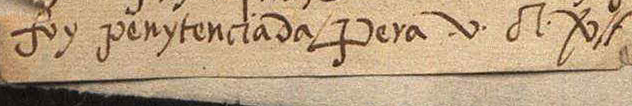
foy penytenciada / Pera v. A. ꝟ //
